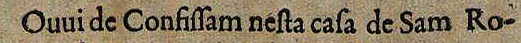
Ouui de Confissam nesta casa de Sam Ro
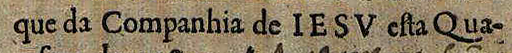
que da Companhia de IESV esta Qua
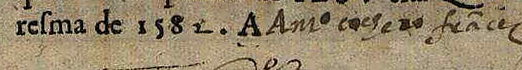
resma de 1582. A Anto cochero frācez
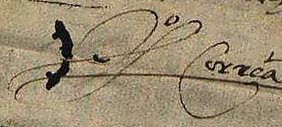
Jo Correa
